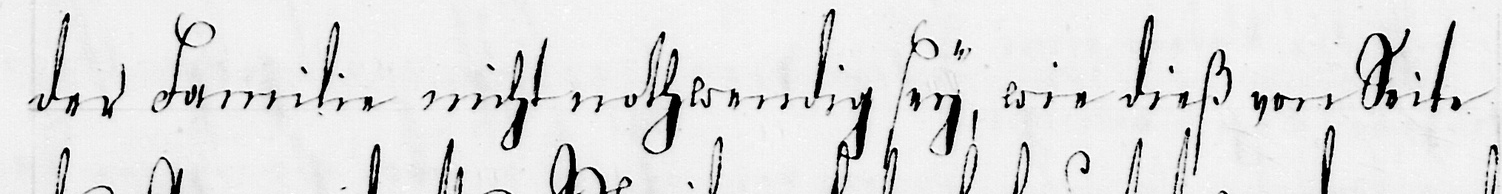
der Familie nicht nothwendig sey, wie dieß von Seite
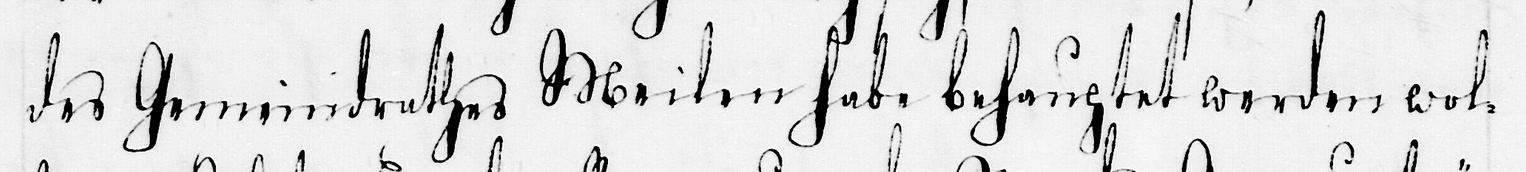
des Gemeindrathes Meilen habe behauptet werden wol¬
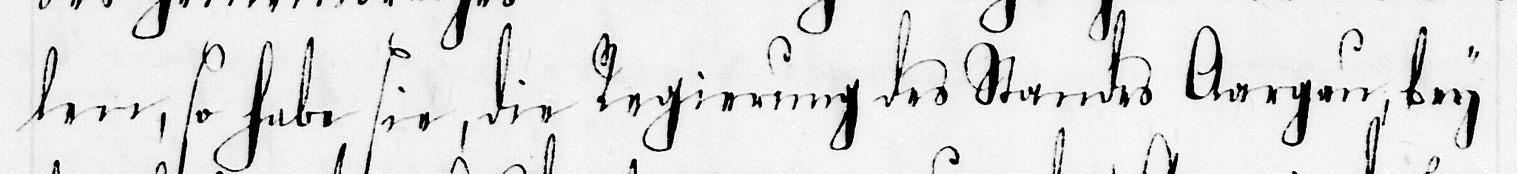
len, so habe sie, die Regierung des Standes Aargau, bey
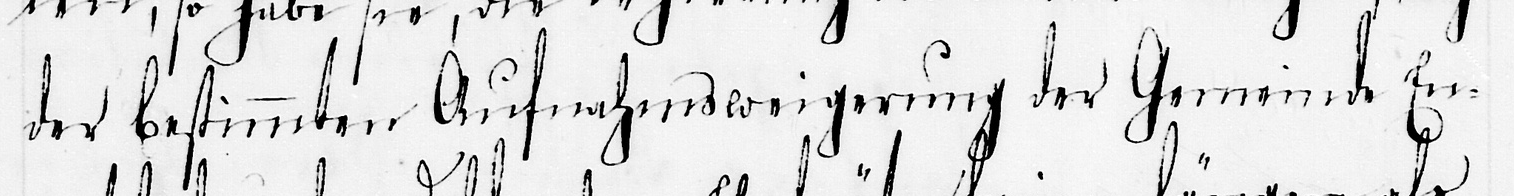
der bestimmten Aufnahmsweigerung der Gemeinde En¬
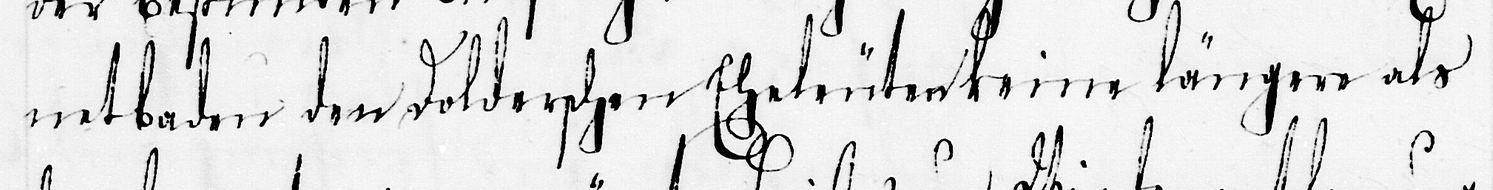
netbaden den Dolderschen Eheleuten keine längere als
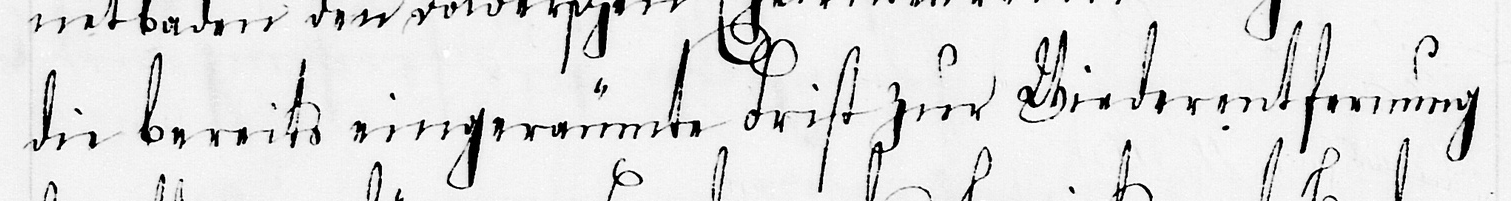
die bereits eingeräumte Frist zur Wiederentfernung
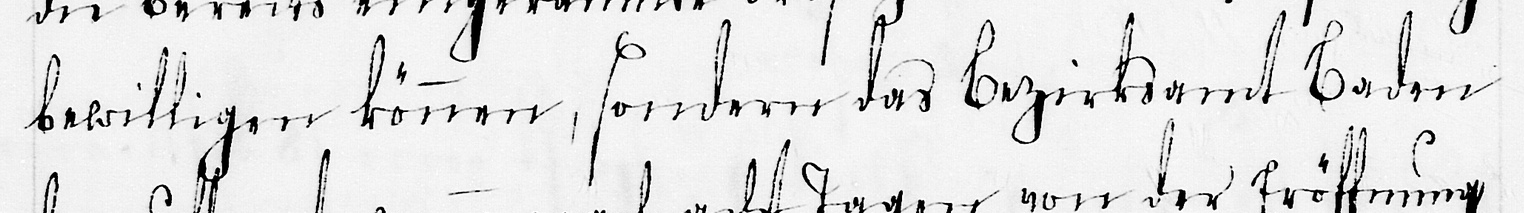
bewilligen können, sondern das Bezirksamt Baden
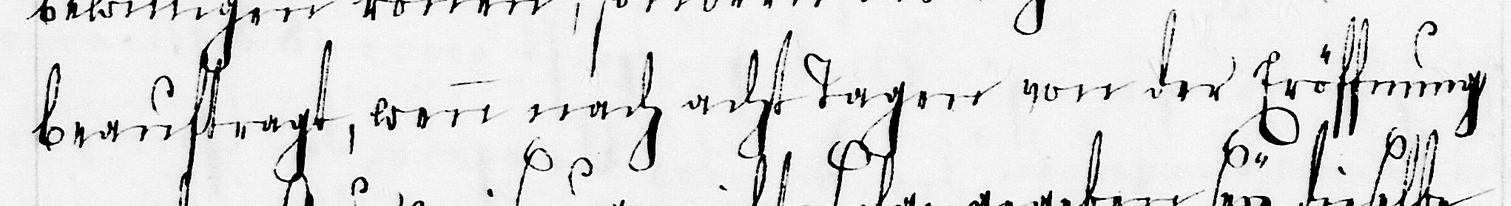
beauftragt, wenn nach acht Tagen von der Eröffnung
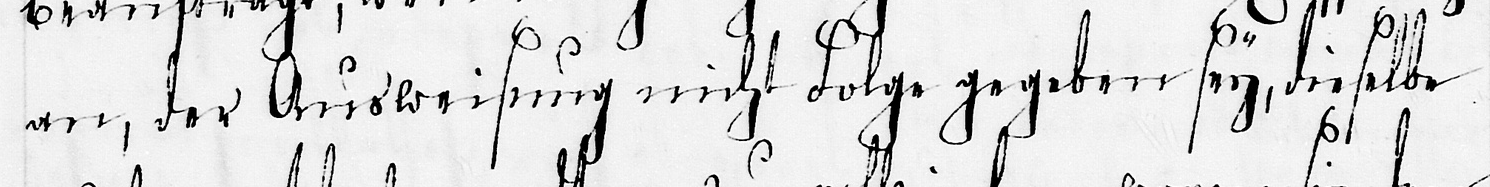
an, der Ausweisung nicht Folge gegeben sey, dieselbe
